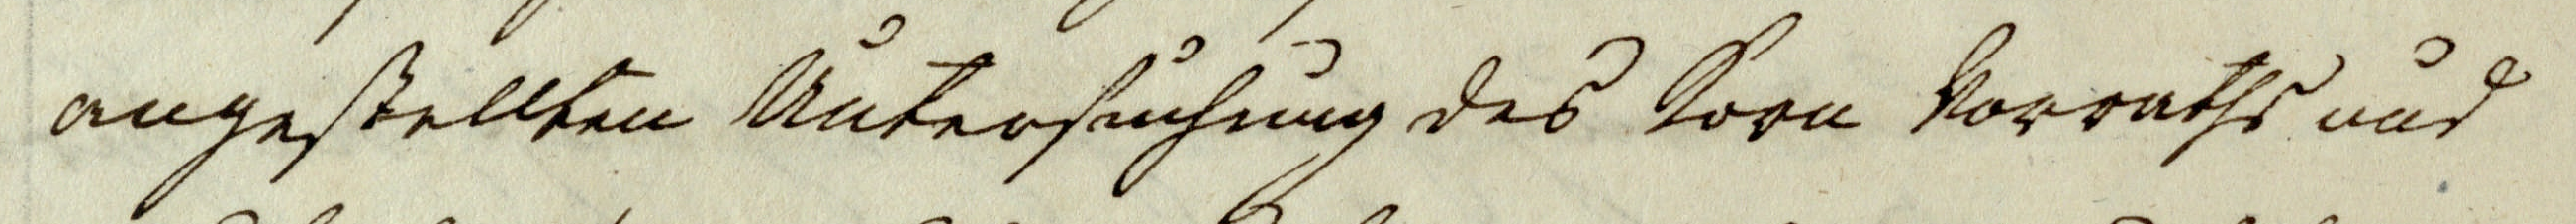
angestellten Untersuchung des Korn Vorraths und
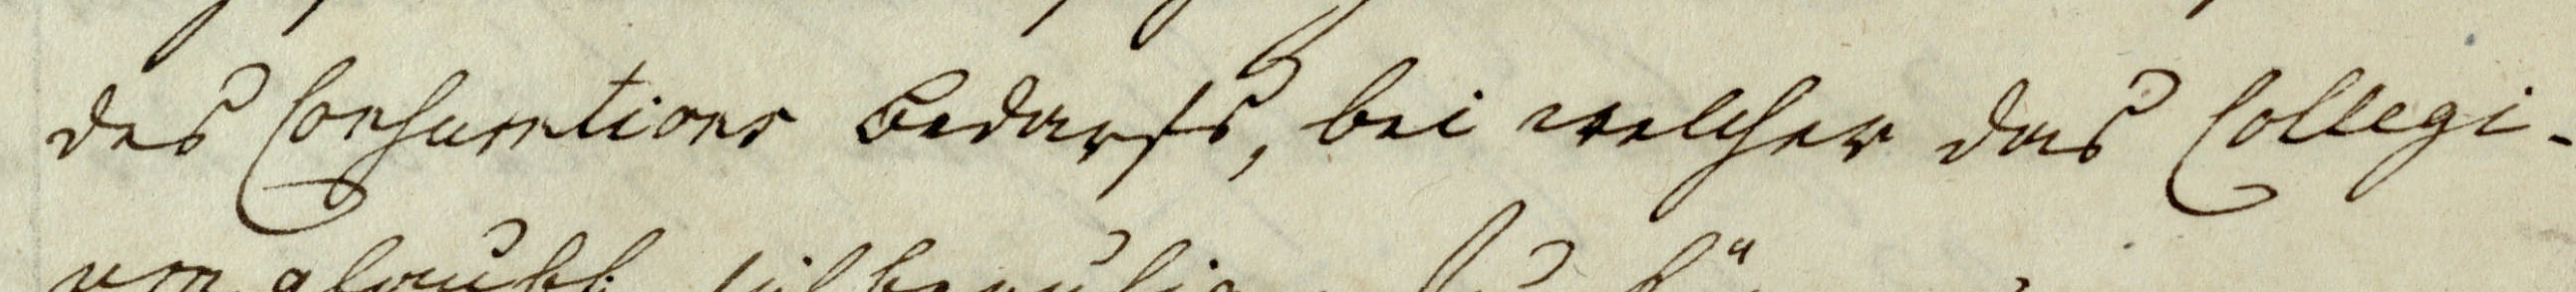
des Consumtions Bedarfs, bei welcher das Collegi¬
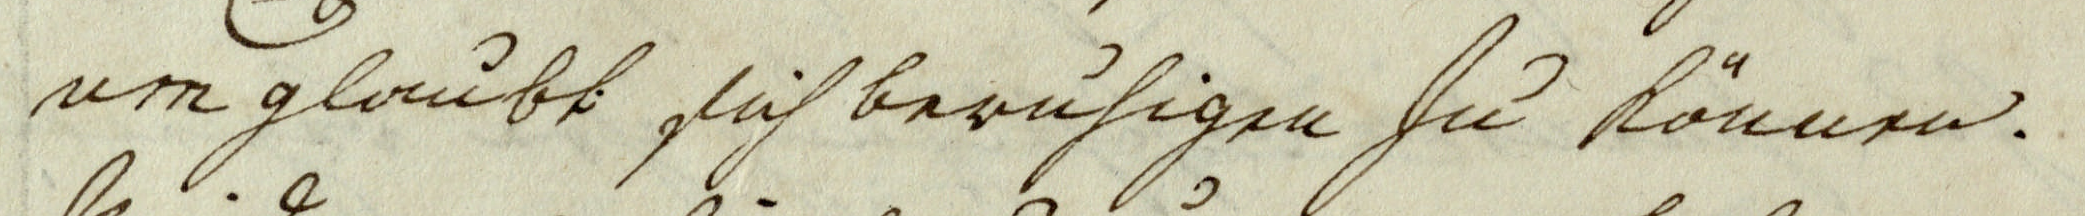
um glaubt sich beruhigen zu können.
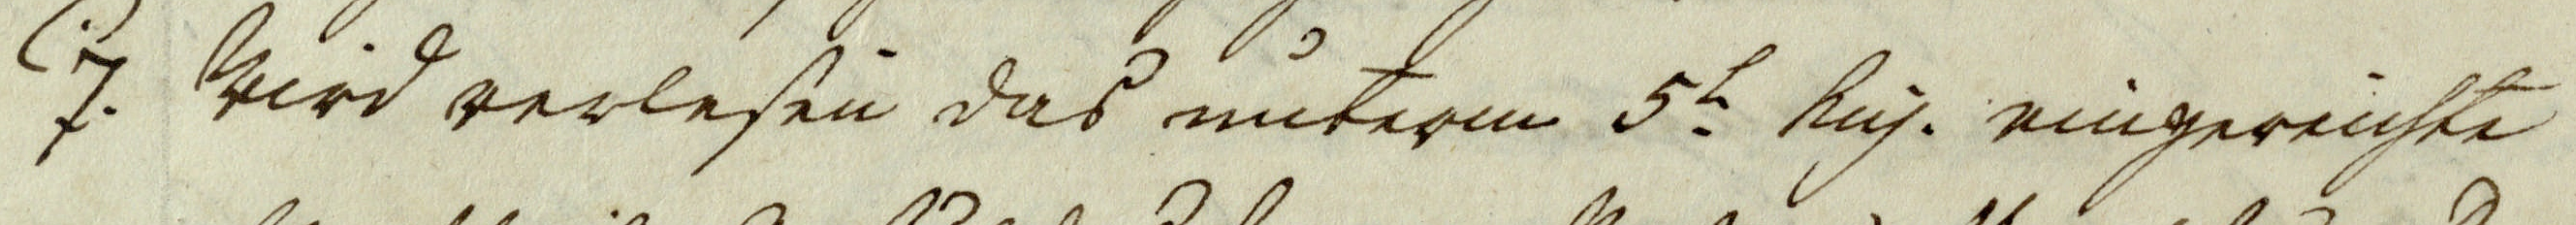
7. Wird verlesen das unterm 5t. huj. eingereichte
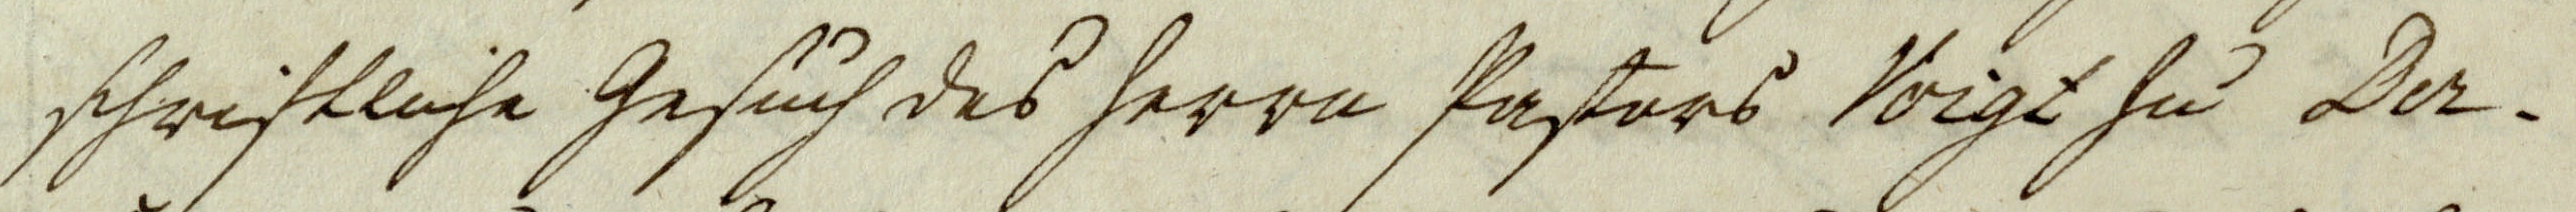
schriftliche Gesuch des Herrn Pastors Voigt zu Da¬
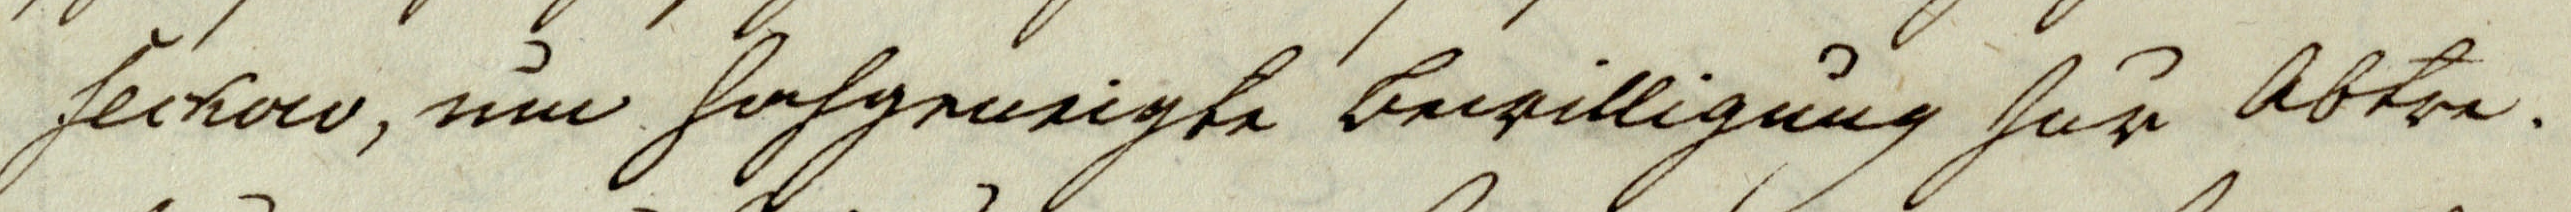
seckow, um Hochgeneigte Bewilligung zur Abtre¬
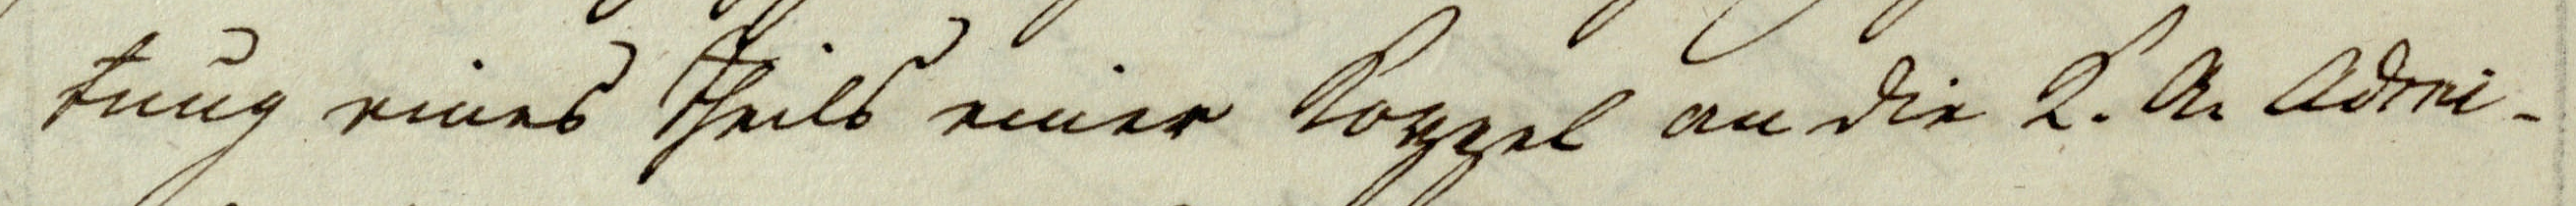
tung eines Theils einer Koppel an die K. A. Admi¬
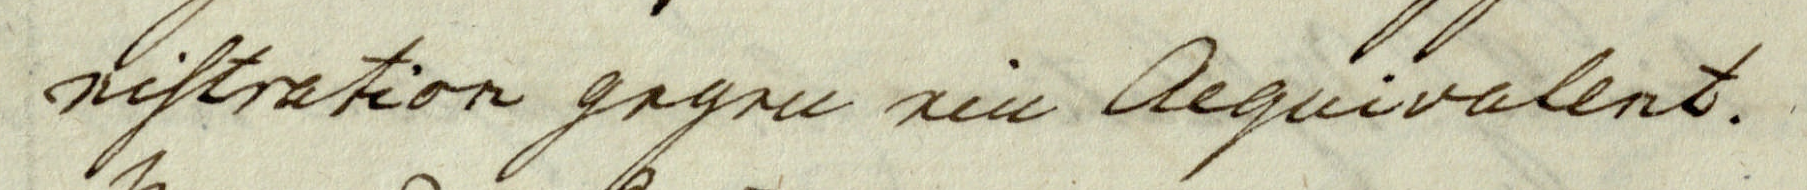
nistration gegen ein Aequivalent.
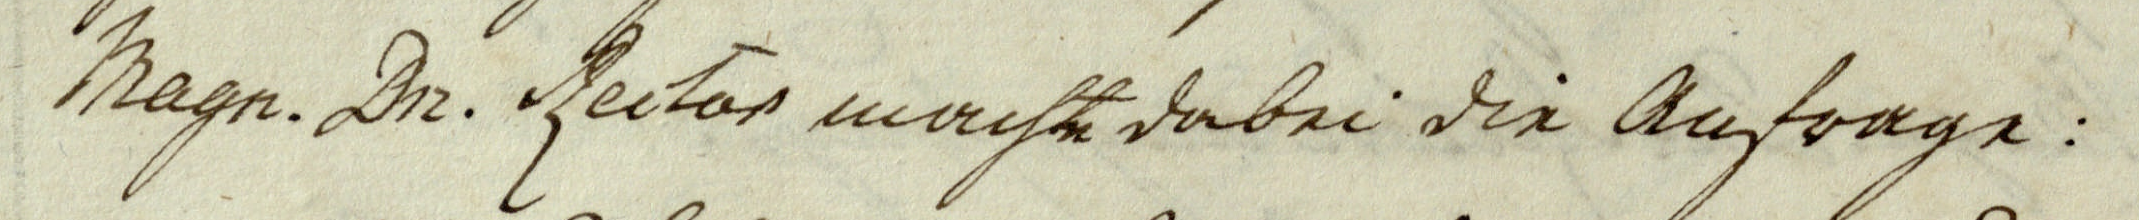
Magn. Dn. Rector machte dabei die Anfrage:
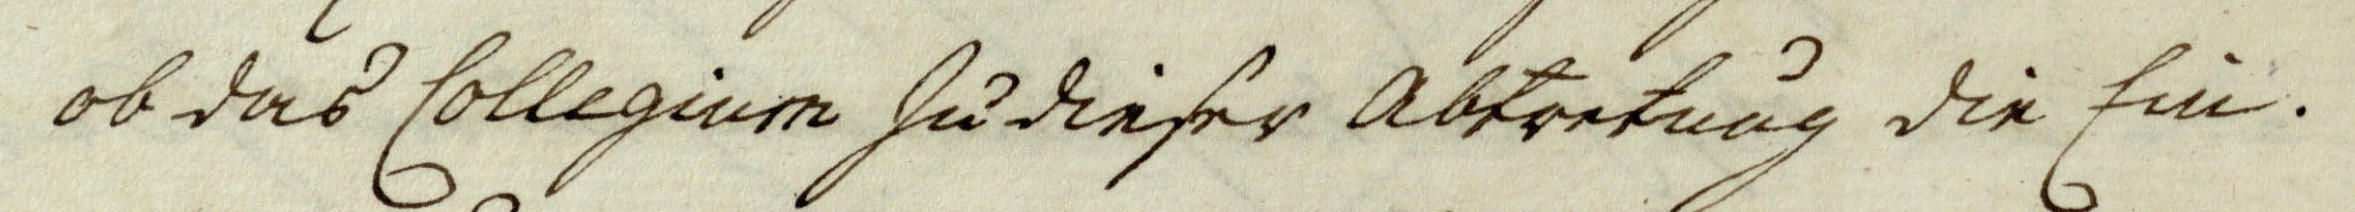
ob das Collegium zu dieser Abtretung die Ein¬
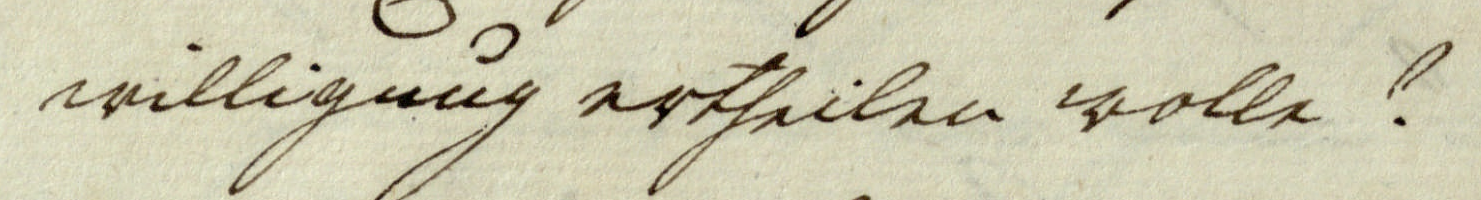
willigung ertheilen wolle?
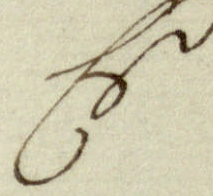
Es
